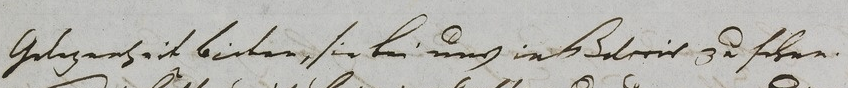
Gelegenheit bieten, sie bei uns in Belvoir zu sehen.
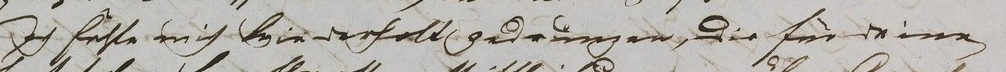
Ich fühle mich wiederholt gedrungen, dir für Deine
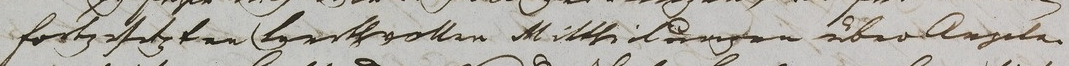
fortgesetzten werthvollen Mittheilungen über Angele-
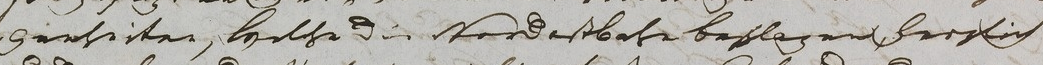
genheiten, welche die Nordostbahn beschlagen, herzlich
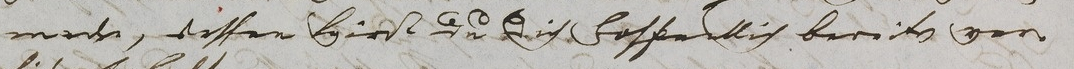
mache, dessen wirst Du Dich hoffentlich bereits ver-
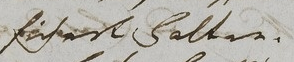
sichert halten.
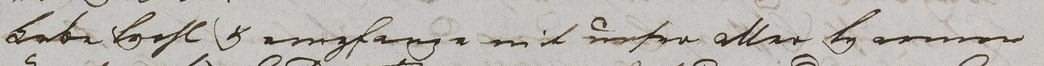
Lebe wohl & empfange mit unser aller warmen
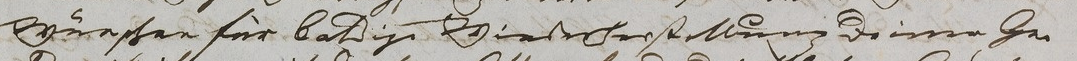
Wünschen für baldige Wiederherstellung Deiner Ge-
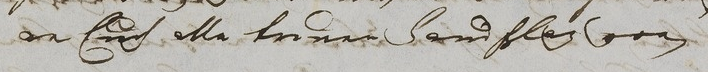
an Euch alle treuen Handschlag von
